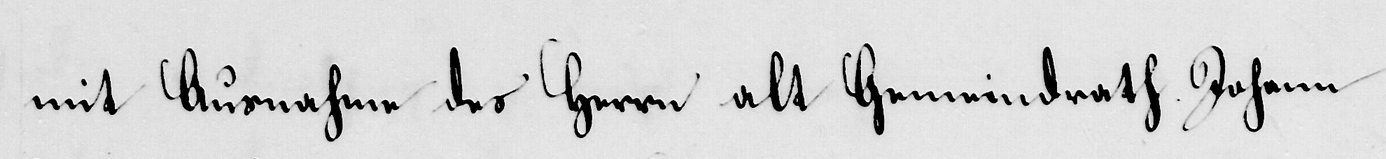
mit Ausnahme des Herrn alt Gemeindrath Johann
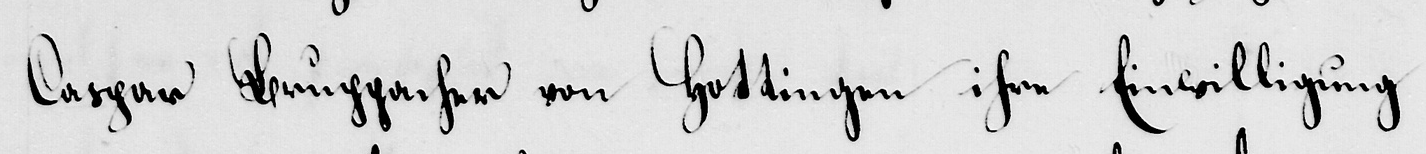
Caspar Bruppacher von Hottingen ihre Einwilligung
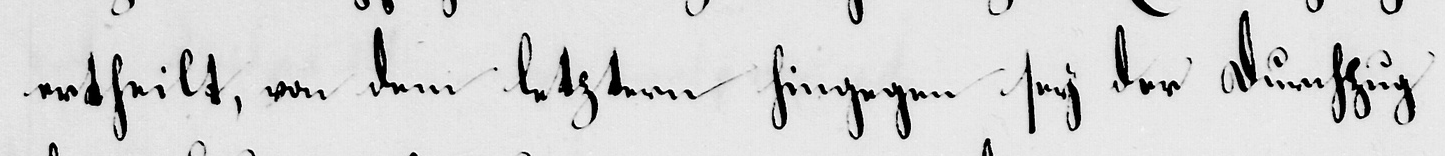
ertheilt, von dem letztern hingegen sey der Durchzug
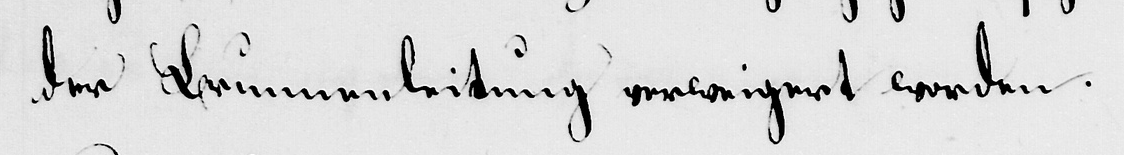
der Brunnenleitung verweigert worden.
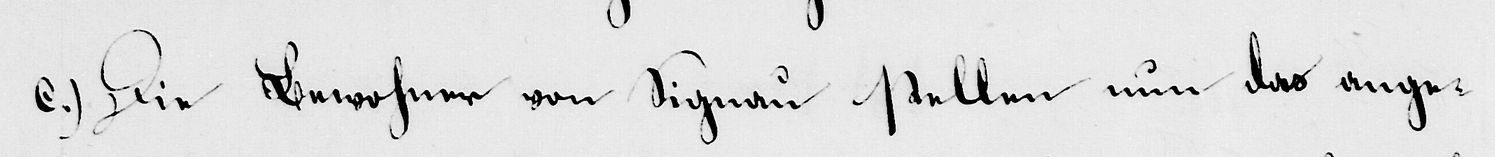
c.) Die Bewohner von Signau stellen nun das ange¬
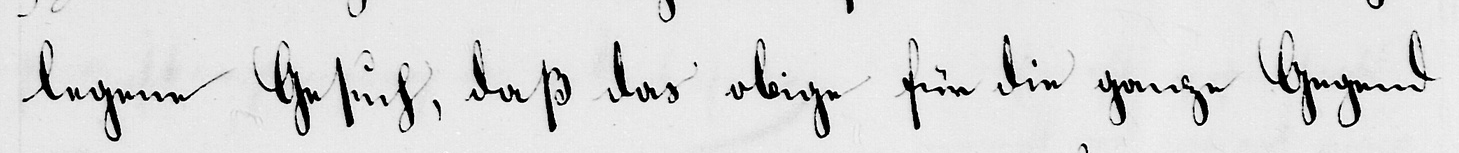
legene Gesuch, daß das obige für die ganze Gegend
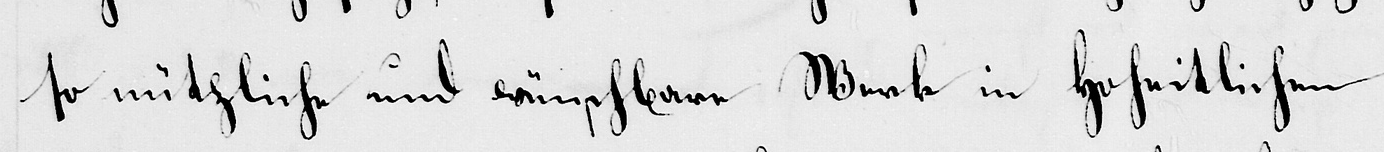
so nützliche und wünschbare Werk in Hoheitlichen
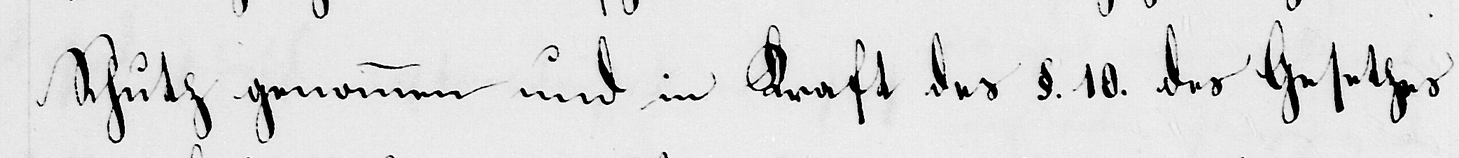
Schutz genommen und in Kraft des §. 10. des Gesetzes
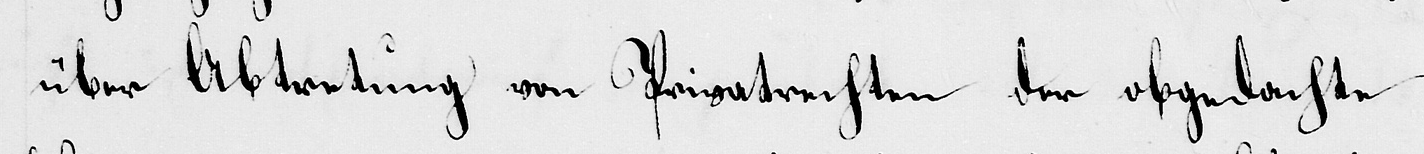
über Abtretung von Privatrechten der obgedachte
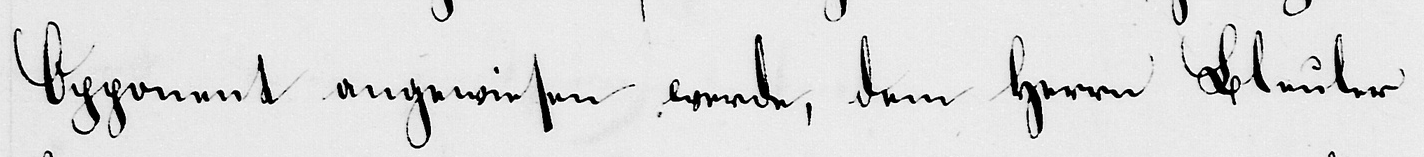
Opponent angewiesen werde, dem Herrn Bleuler
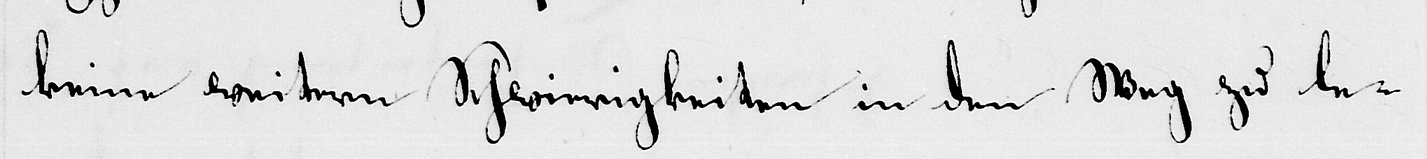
keine weitern Schwierigkeiten in den Weg zu le¬
